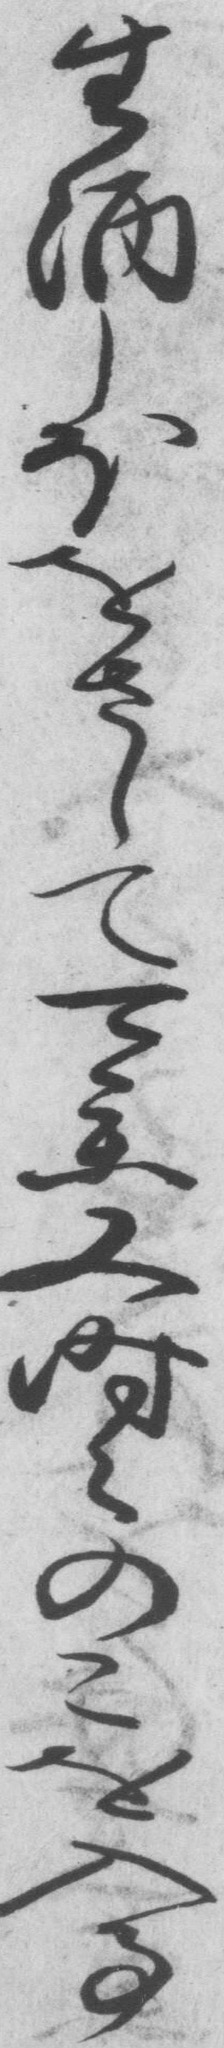生酒しほをさして可参又時々のこを入事
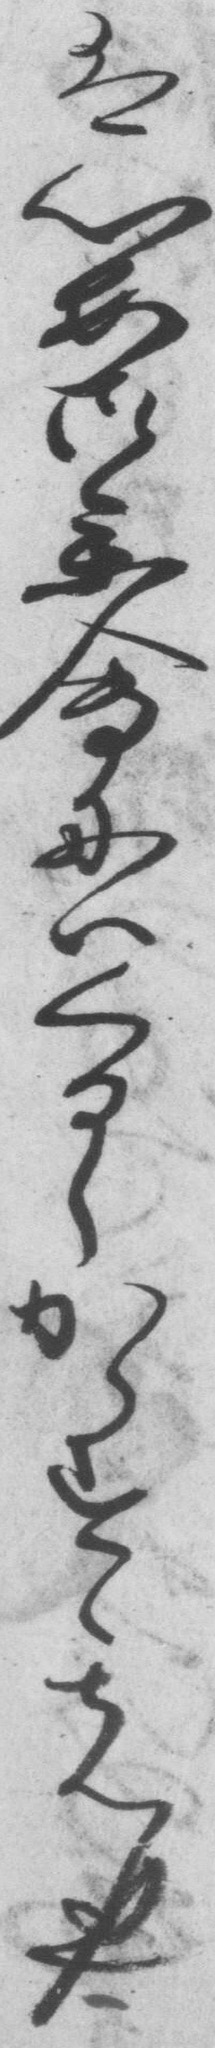は心安御参会にはくるしからす候者也

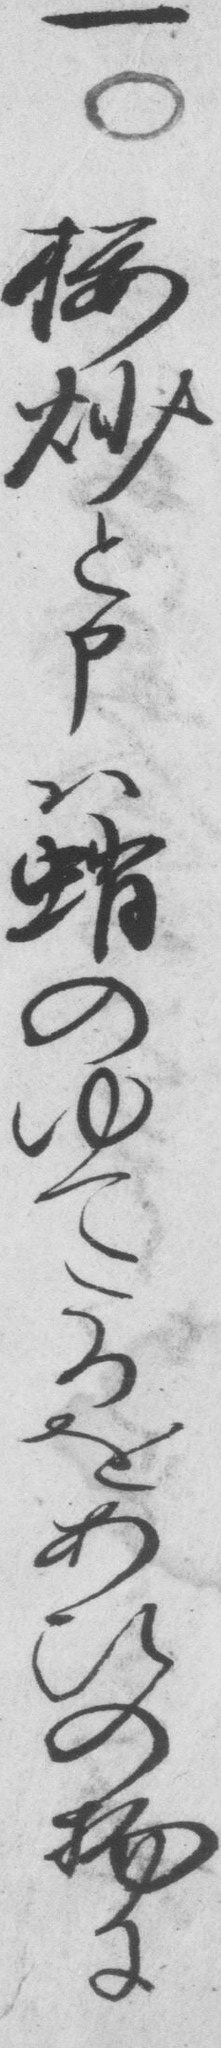一○桜炒と申は蛸のゆてたるをあひの物に
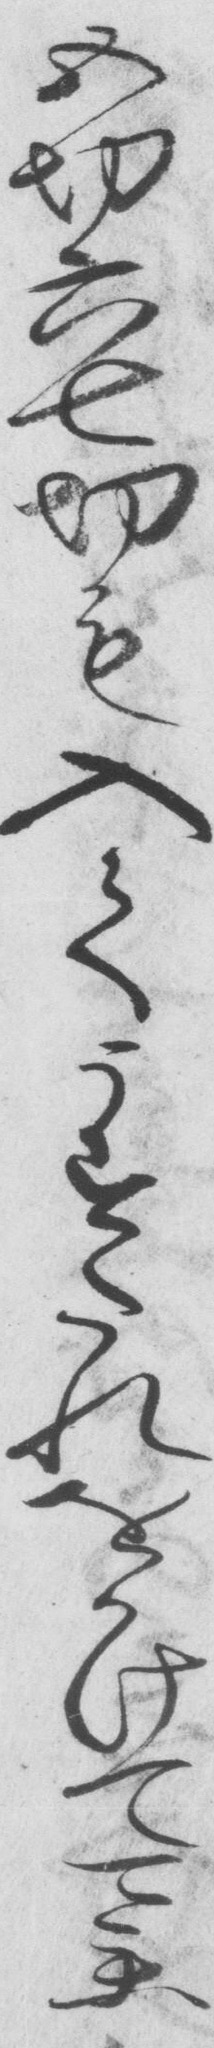五切六七切も入てうすたれをかけて可参
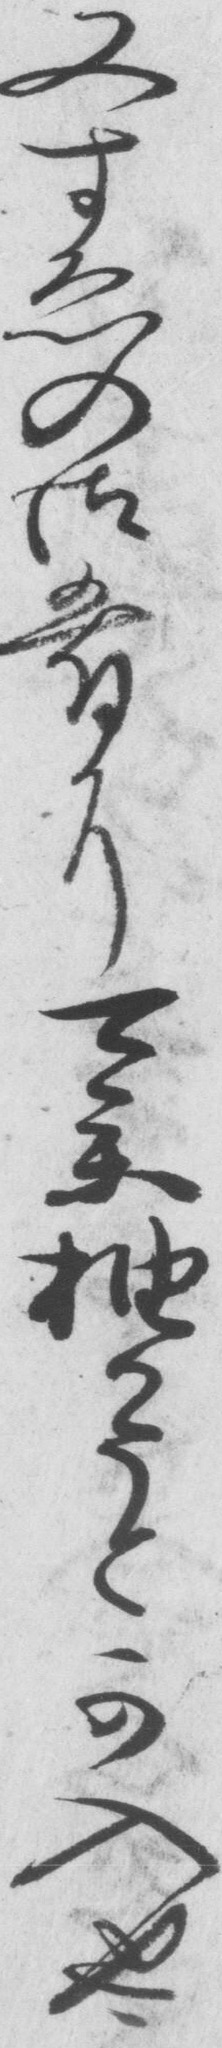又すゑの御肴に可参柚かうと可入也
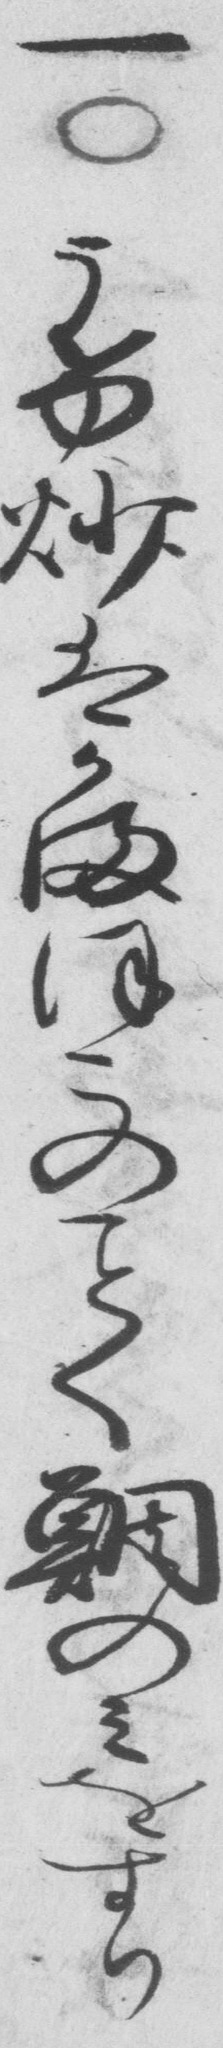一○うけ炒はかまほこのことく鯛のみをすり
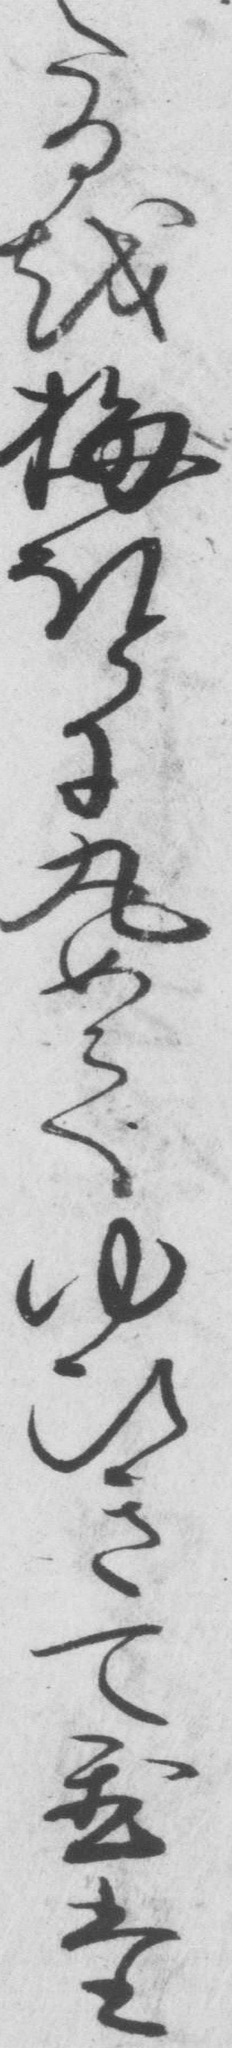たるを梅ほとに丸めてゆひきて置た
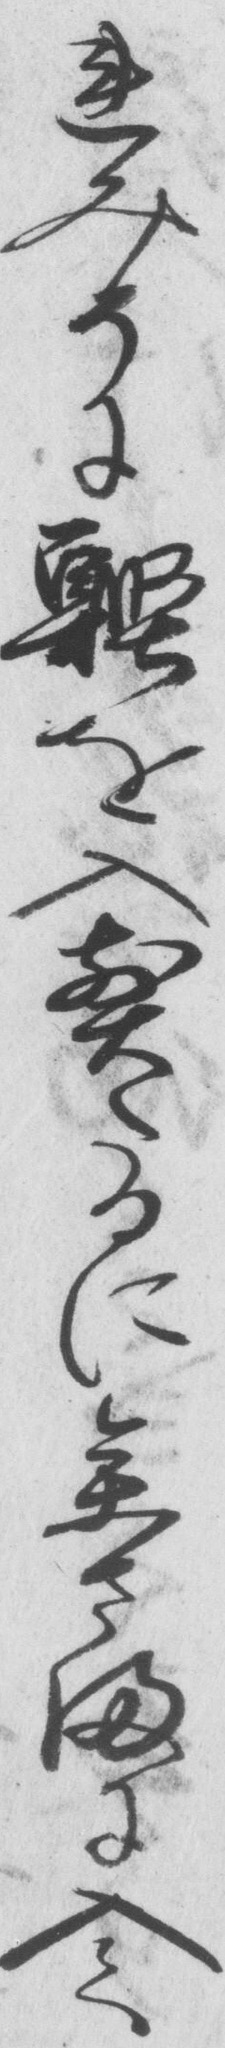れみそに鰹を入煮たるに参さまに入て
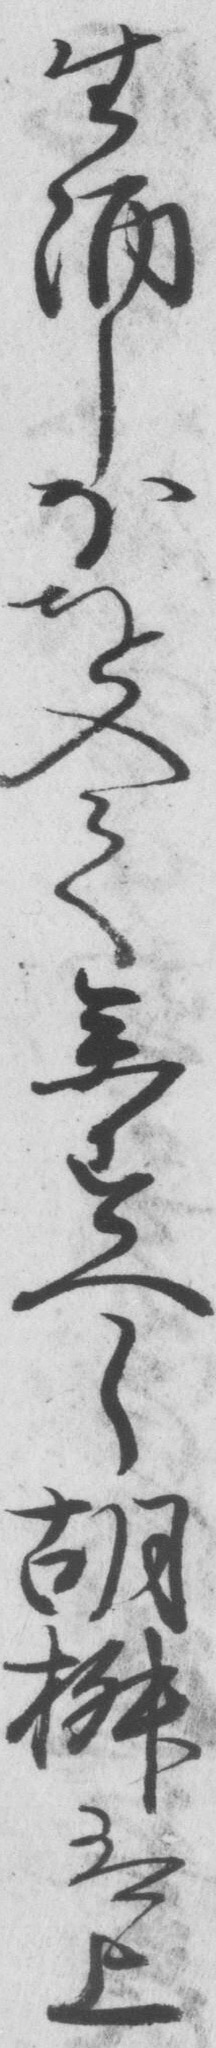生酒しほを入て参すへし胡椒は上
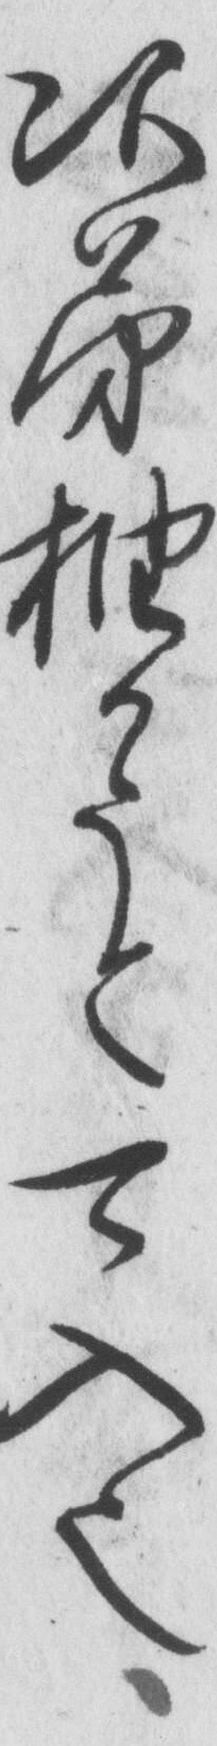次第柚かうと可入也
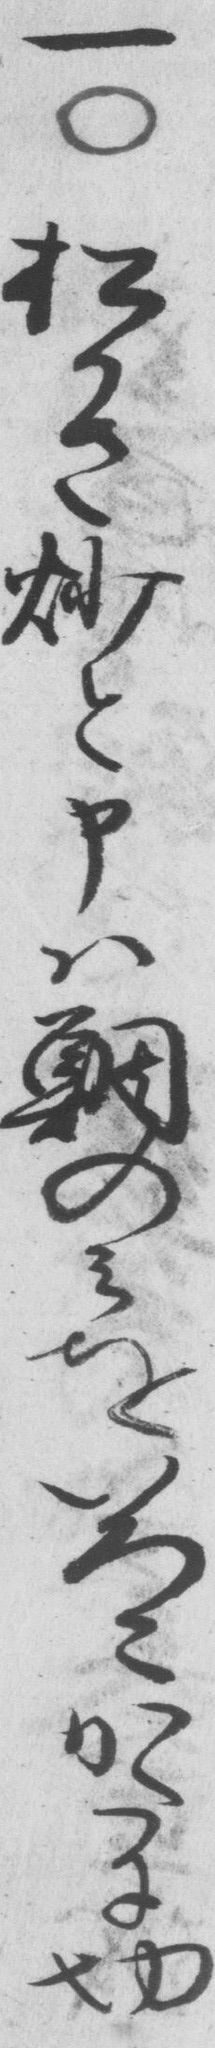一○松かさ炒と申は鯛のみをいろ〳〵かたに切
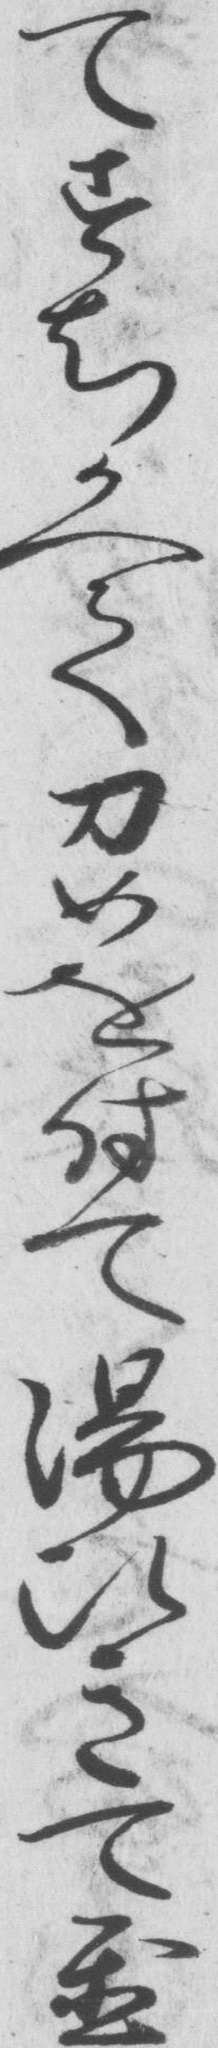てすちかへて刀めを付て湯ひきて置
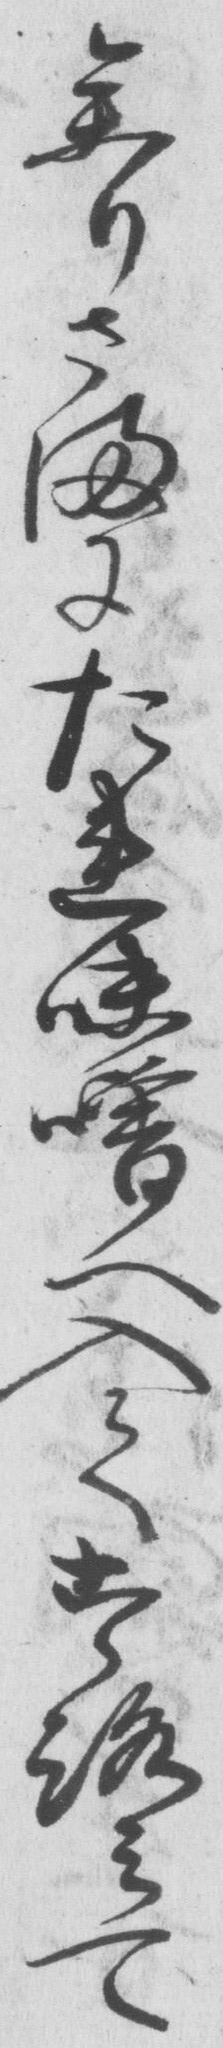参りさまにたれ味噌へ入てこゝろみて
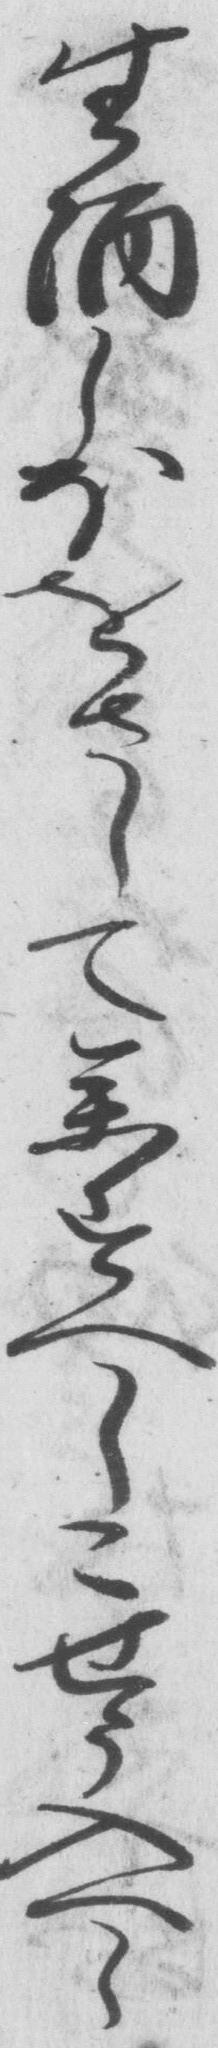生酒しほをさして参すへしこせう入へし
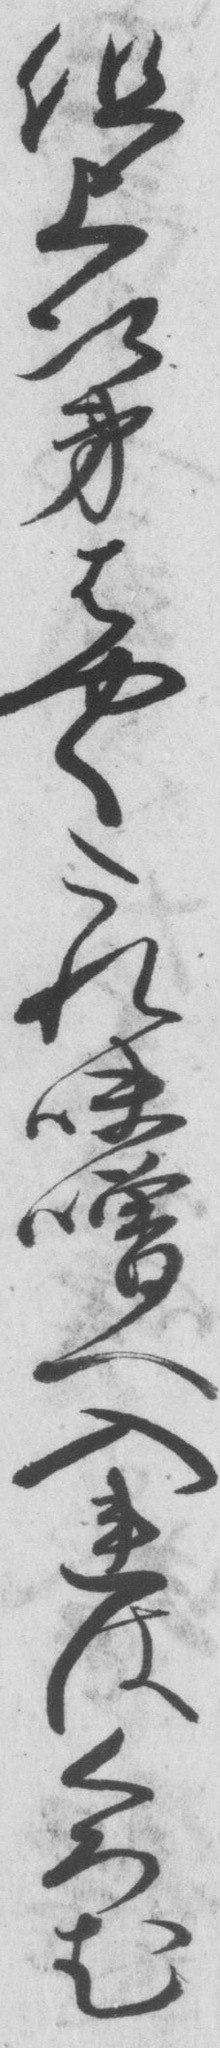但上次第はやくたれ味噌へ入れはくろむ
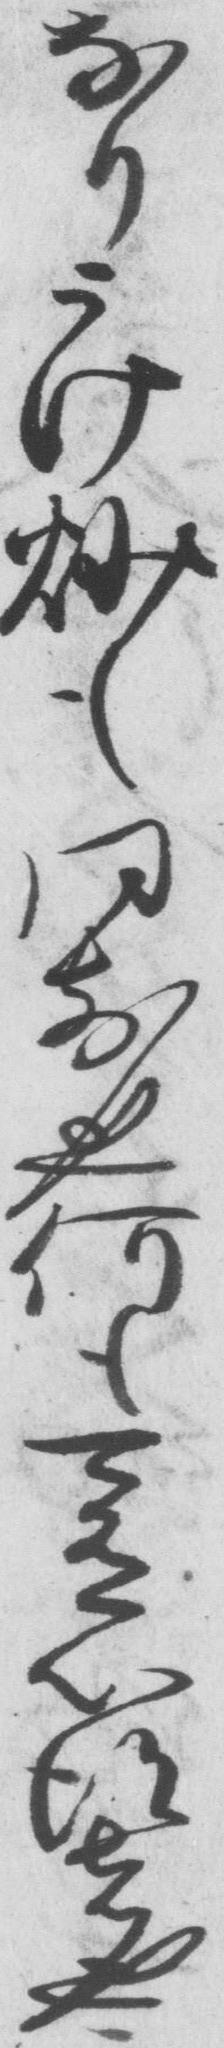なりうけ炒も同前也何も可有心得者也
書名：料理次第
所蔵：大阪府立大学学術情報センター 国文学研究資料館
